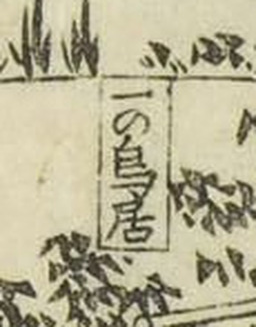一の鳥居
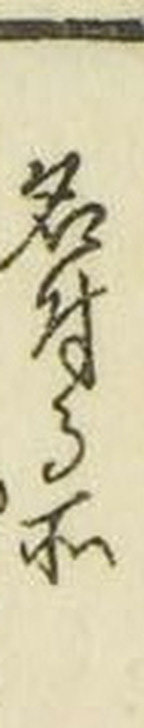名付る所
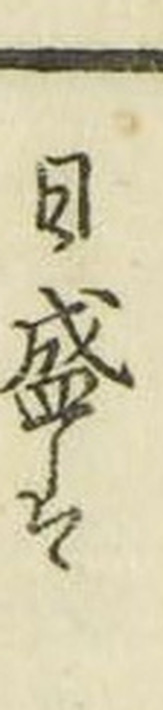日盛は
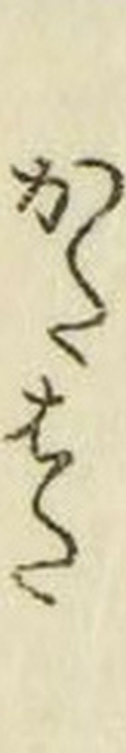かたはた
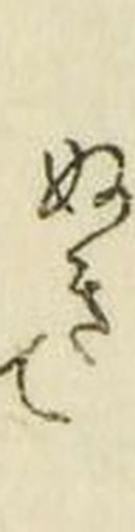ぬきて
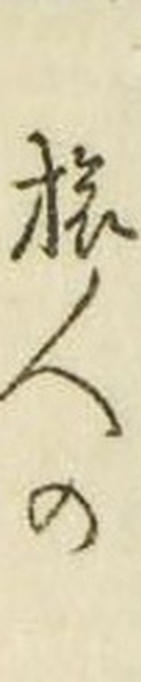旅人の
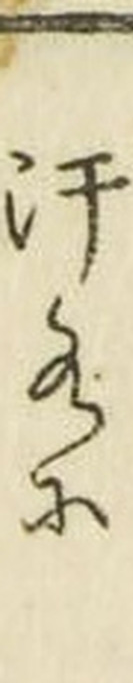汗水に

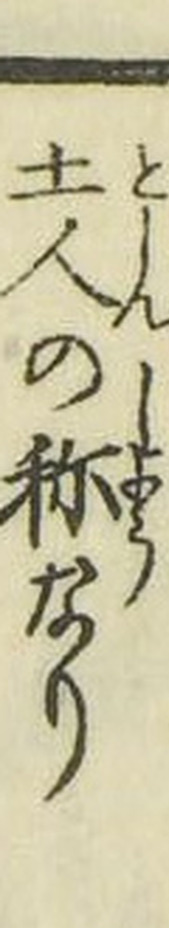土人の称なり
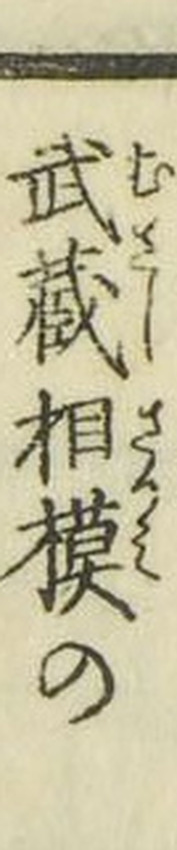武蔵相模の
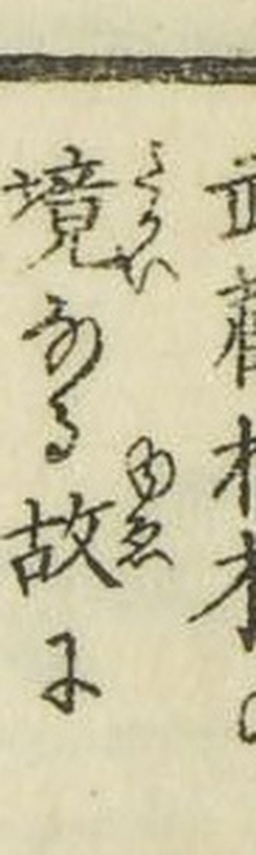境なる故に
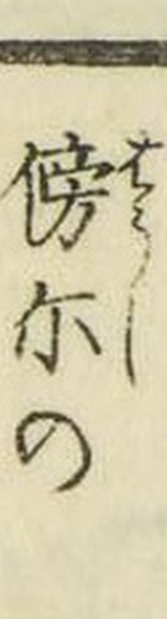傍尓の
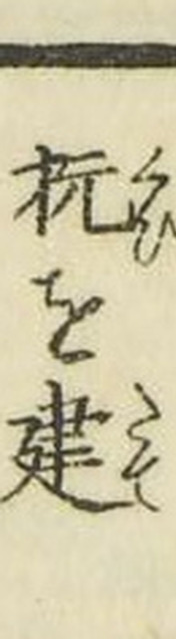杭を建
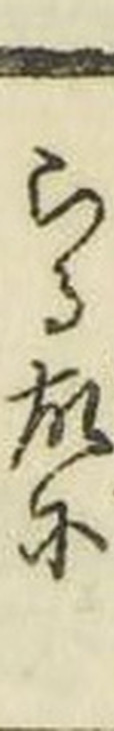らる故に
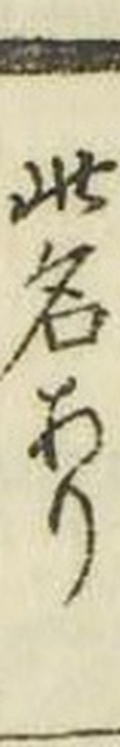此名あり
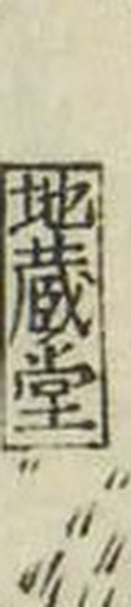地蔵堂

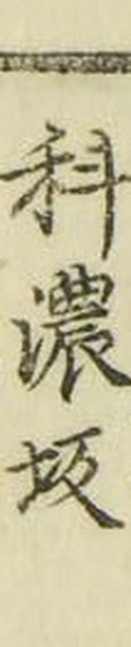科濃坂
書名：江戸名所図会 20巻 巻之6
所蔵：東京学芸大学教育コンテンツアーカイブ
